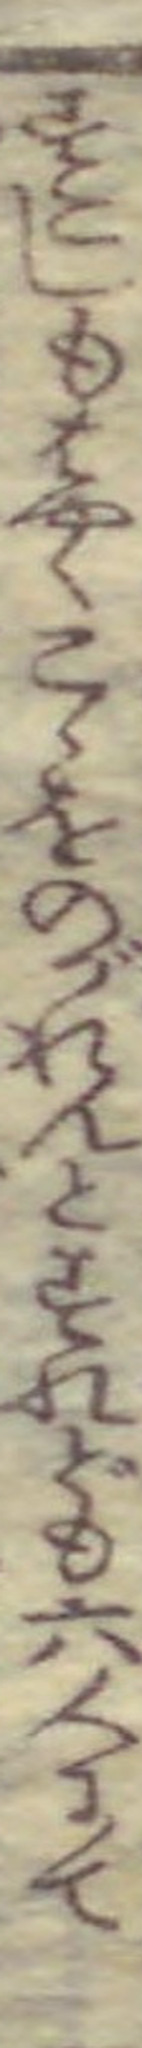すこしもはやくこゝをのがれんとすれども六人にて
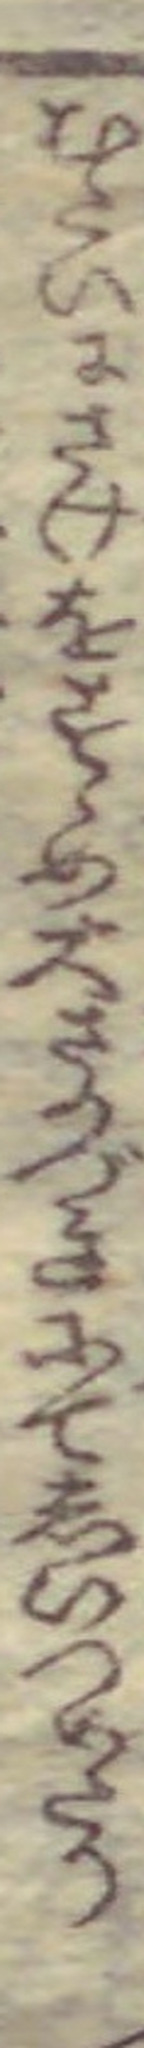むたいにさけをすゝめ大さかづきにてしいつめたり
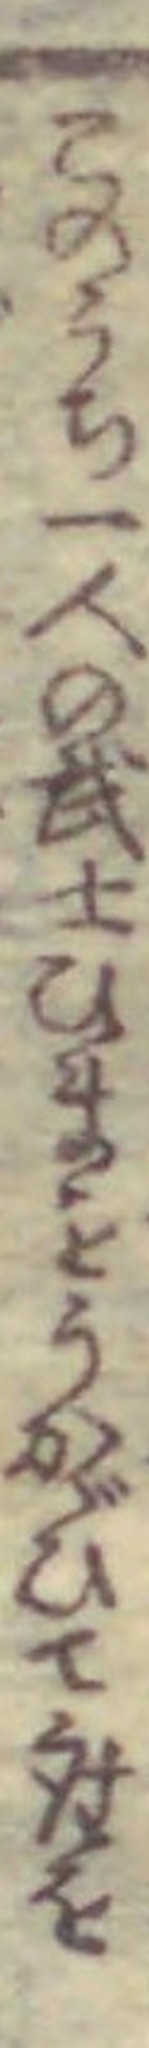このうち一人の武士ひまをうかゞひて座を
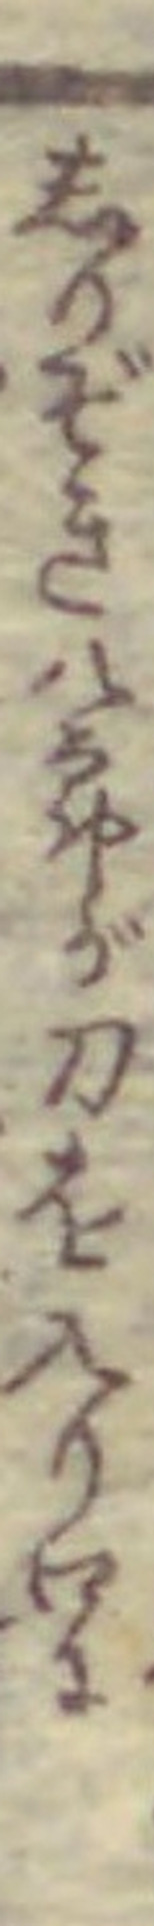しりぞき八郎が刀を入り口に
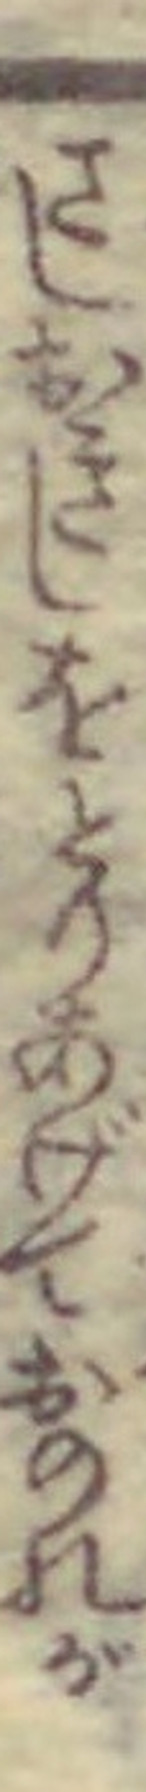さしおきしをとりあげておのれが
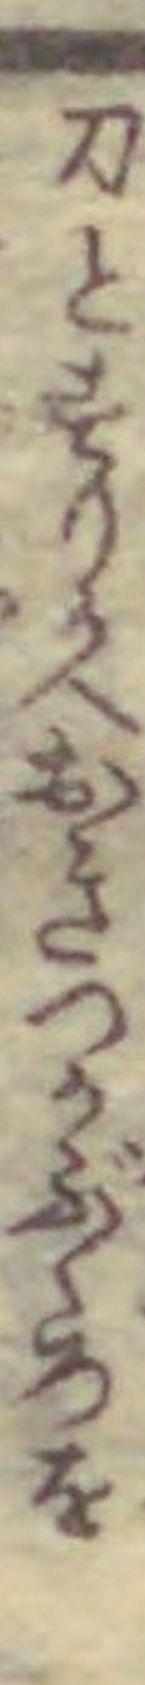刀とすりかへおきつかぶくろを
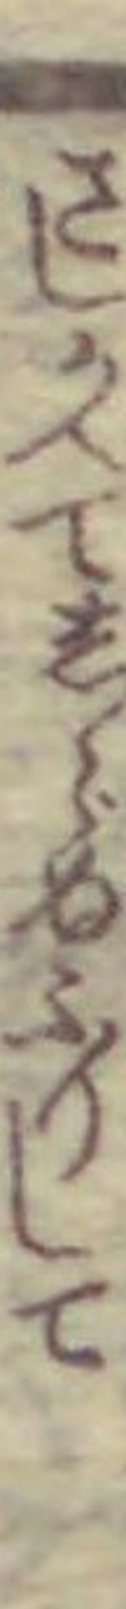さしかへてしらぬふりして
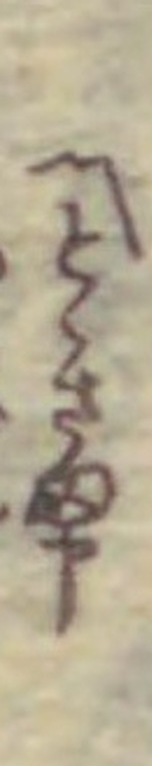〽とゝさま申
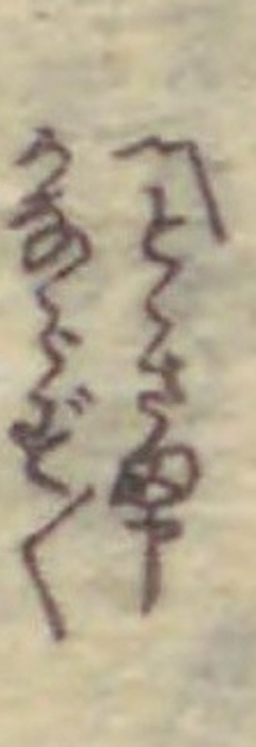かならず〳〵
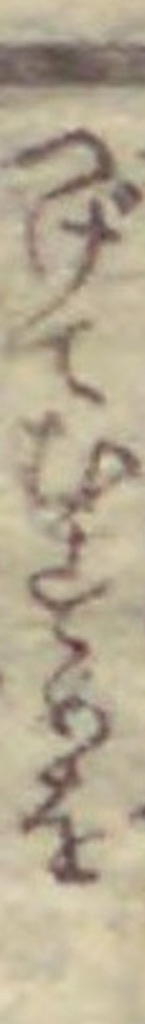つげてむすめを
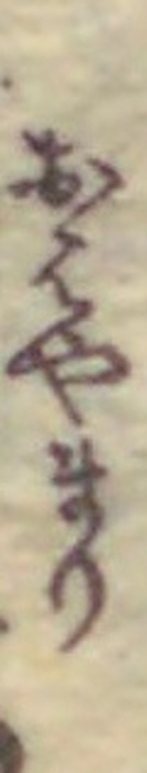おはやまり
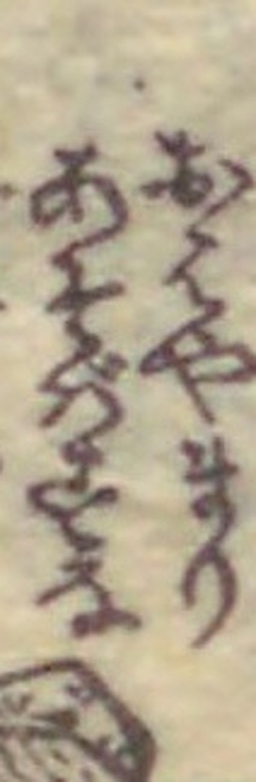あそばすな
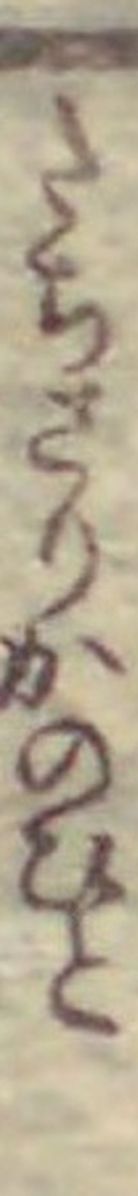たちさりかのひと
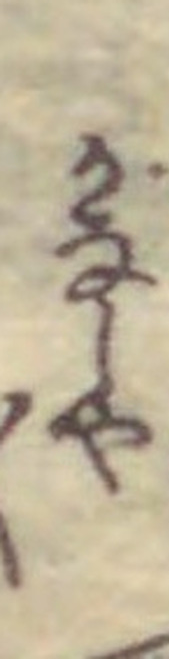かなしや
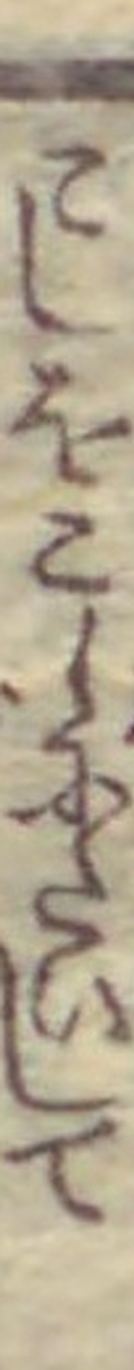こしをこしにたいして
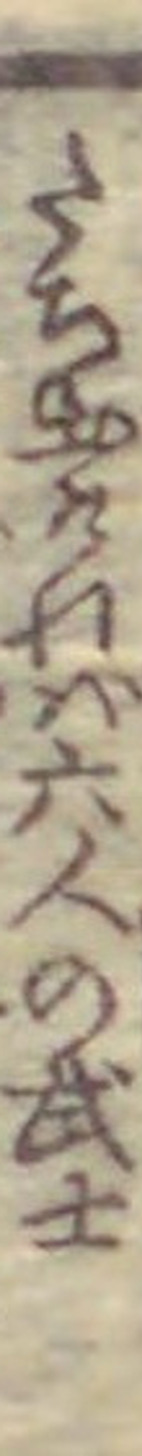たち出ければ六人の武士
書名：八ツ目鱣因縁物語 3巻
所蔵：国立国会図書館 National Diet Library, JAPAN
